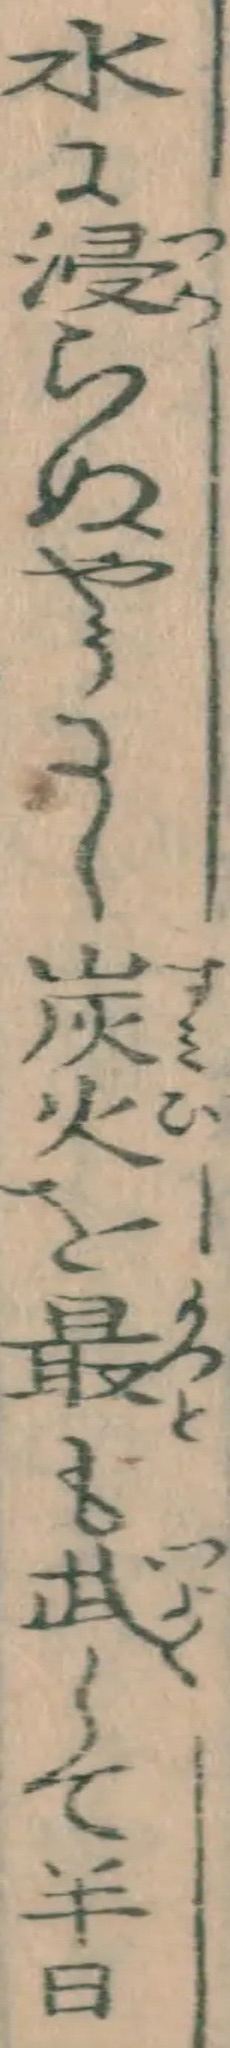水に浸らぬやうにし炭火を最も武して半日
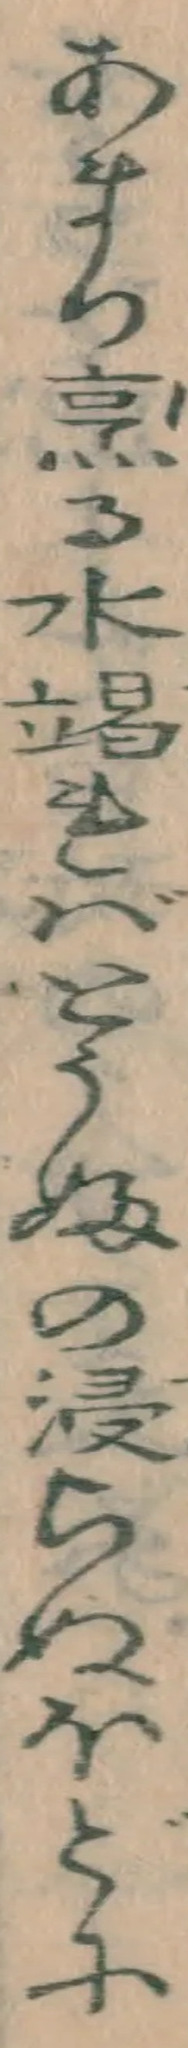あまり烹る水竭ればとうふの浸らぬほとに
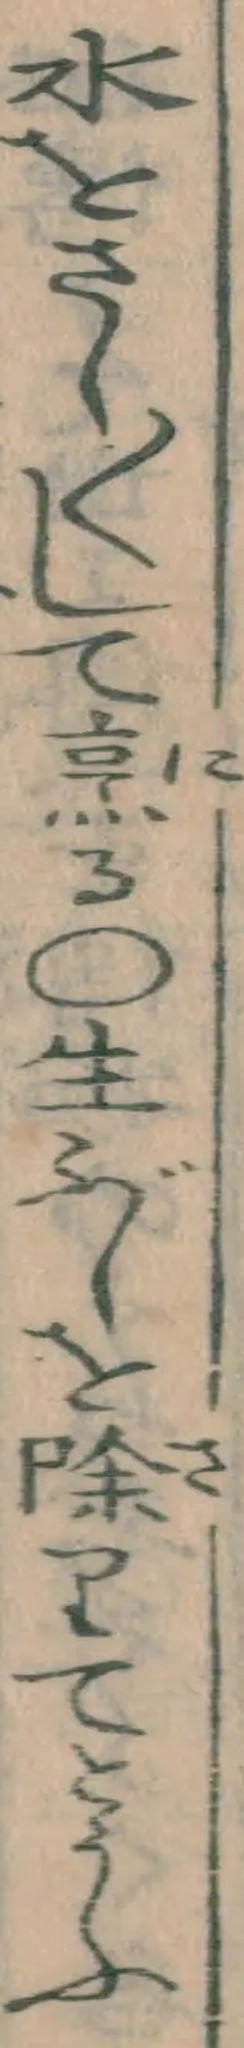水をさし〳〵して烹る○生ぶしを除りてとうふ
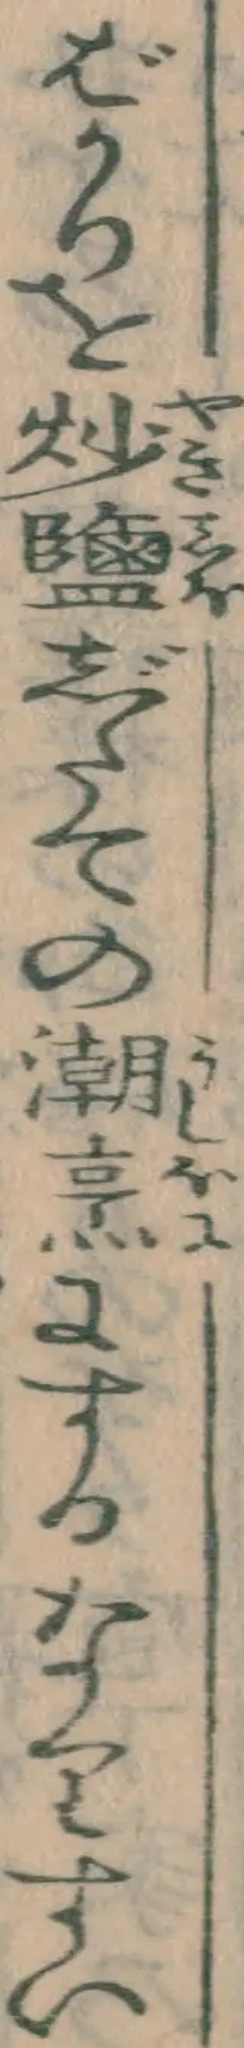ばかりを炒塩じたての潮烹にするなりすい
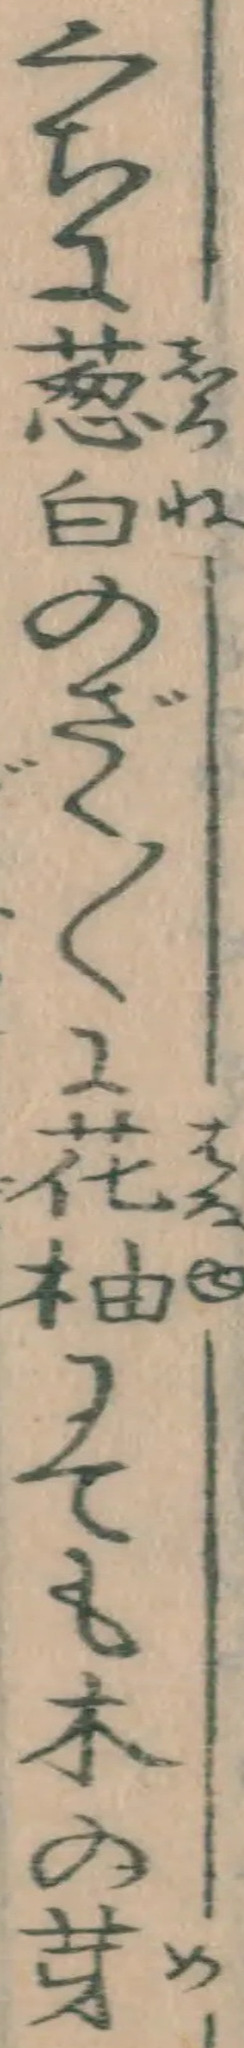くちに葱白のざく〳〵に花柚にても木の芽
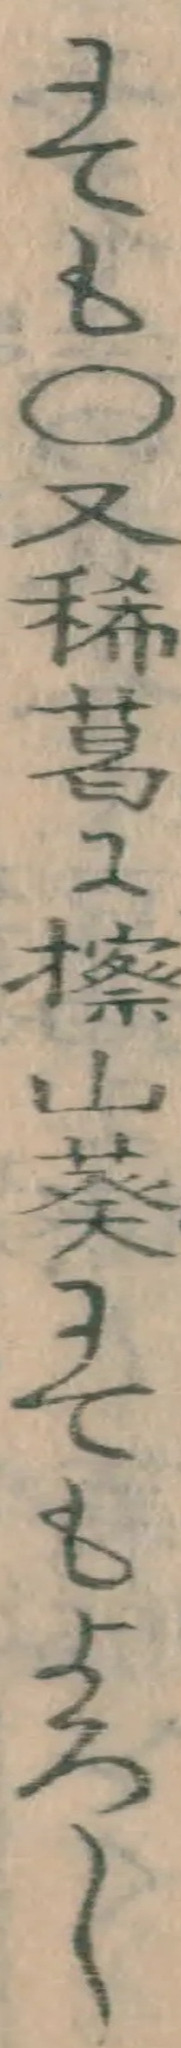にても○又稀葛に擦山葵にてもよろし
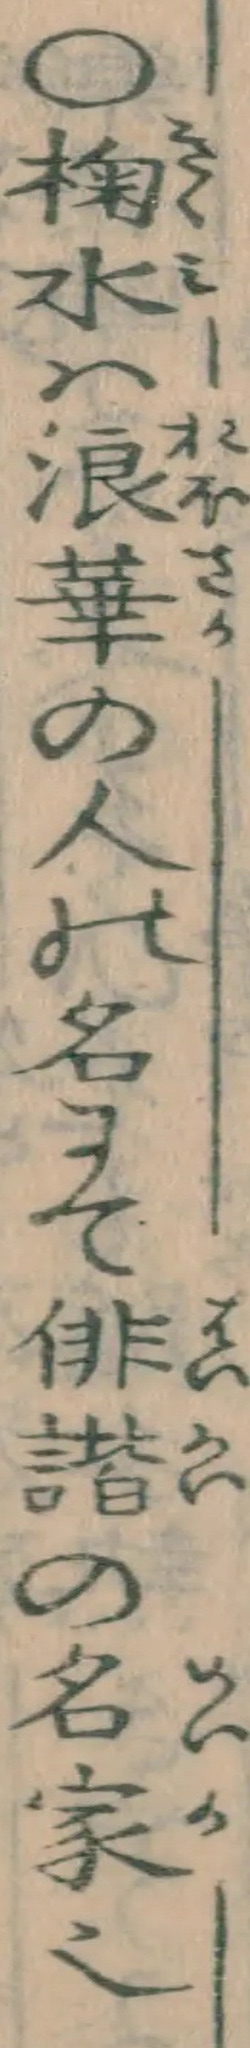○掬水は浪華の人の名にて俳諧の名家也
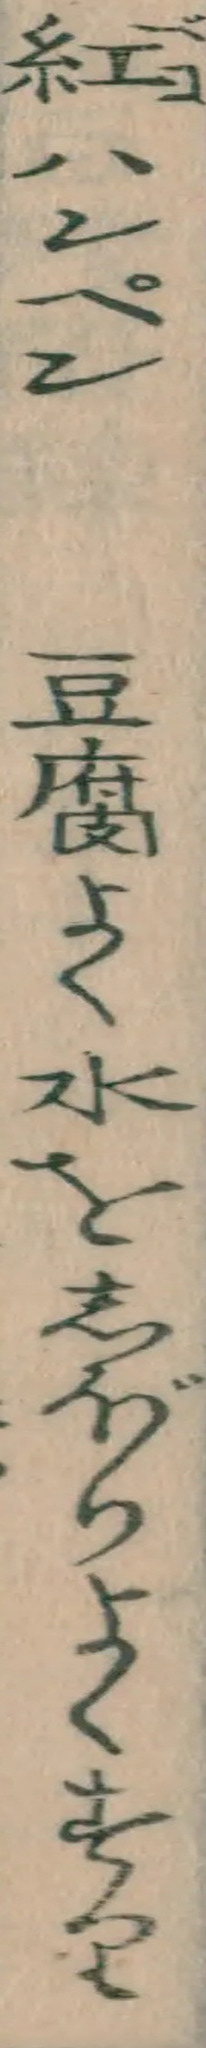百紅ハンペン豆腐よく水をしぼりよくすり
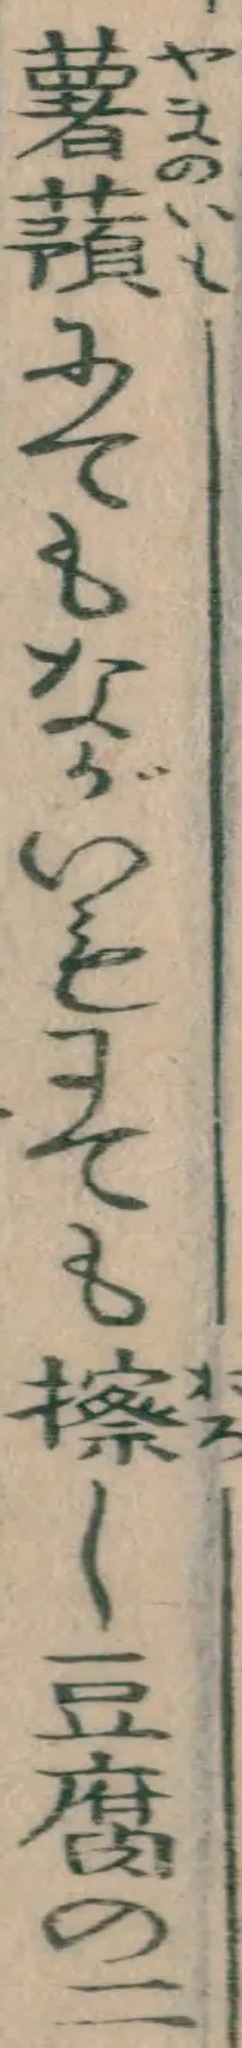薯蕷にてもながいもにても擦し豆腐の二
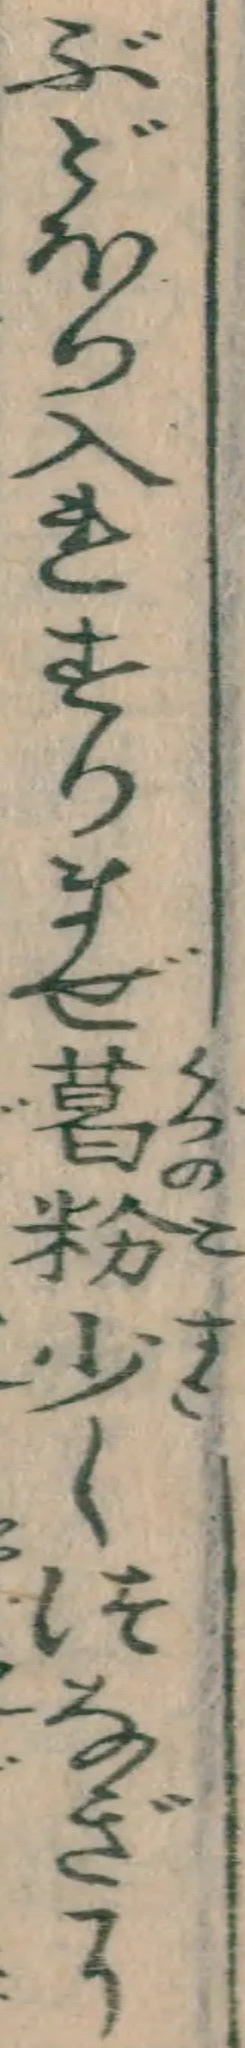ぶどほり入れすりまぜ葛粉少しつなぎに
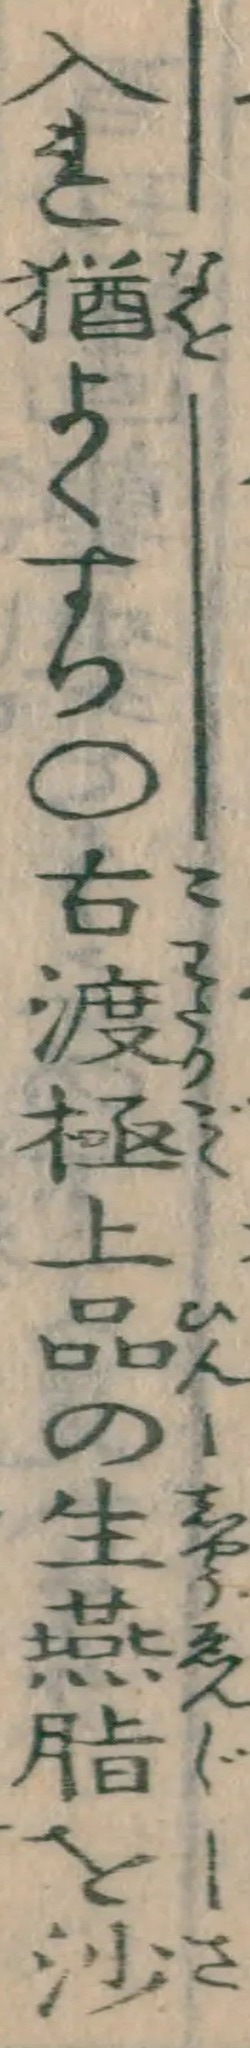入れ猶よくすり○古渡極上品の生燕脂を沙
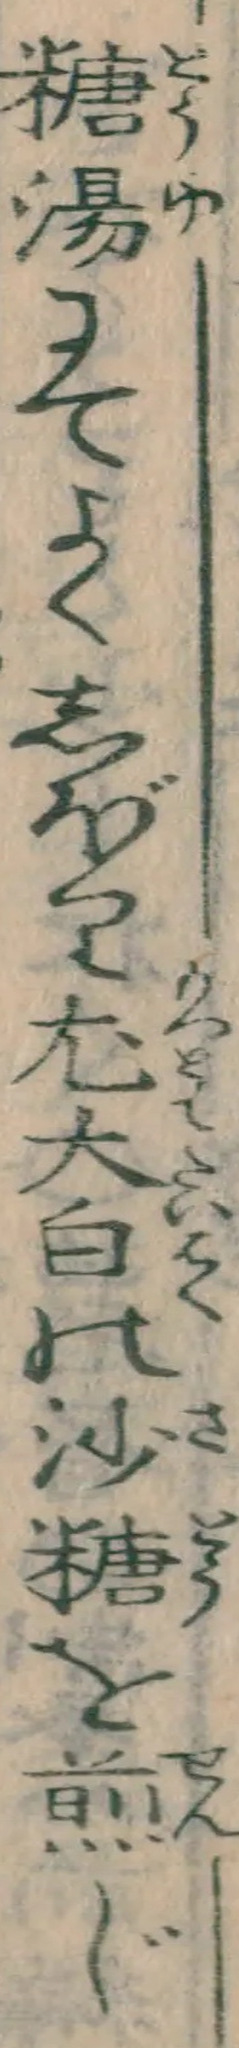糖湯にてよくしぼり尤大白の沙糖を煎じ
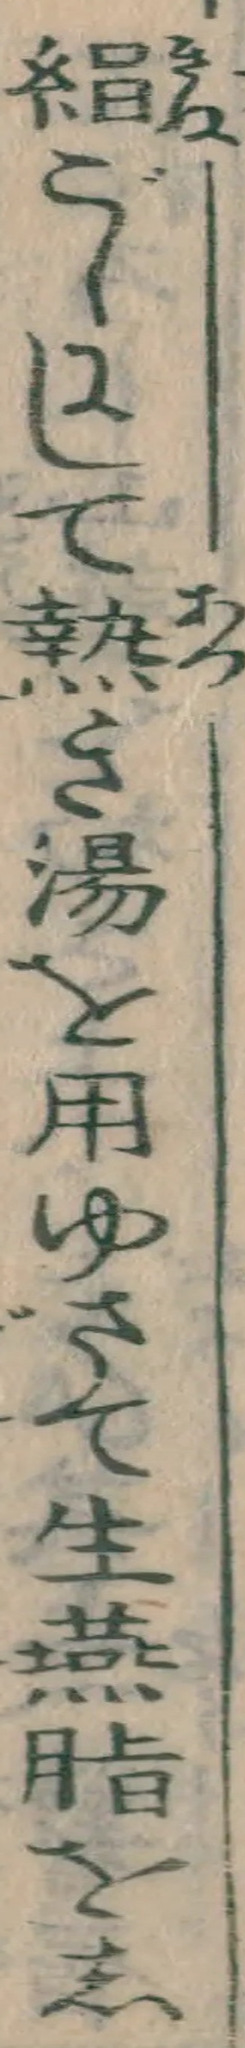絹ごしにして熱き湯を用ゆさて生燕脂をし
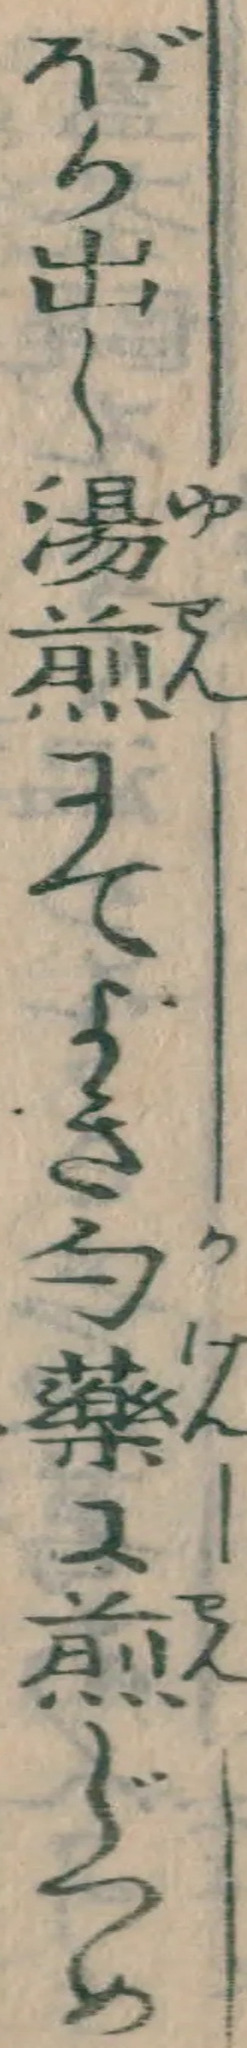ぼり出し湯煎にてよき勺薬に煎じつめ
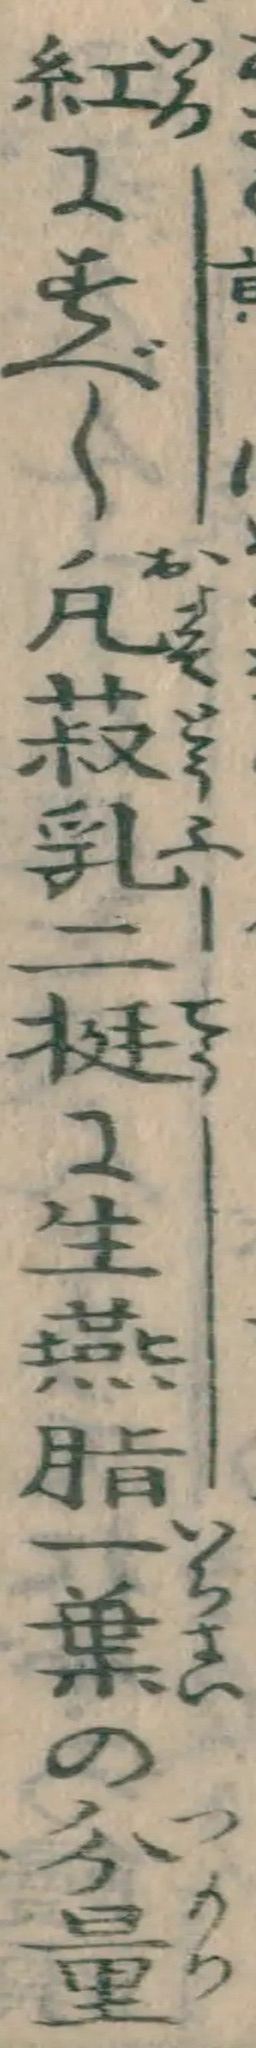紅にすべし凡菽乳二挺に生燕脂一葉の分量
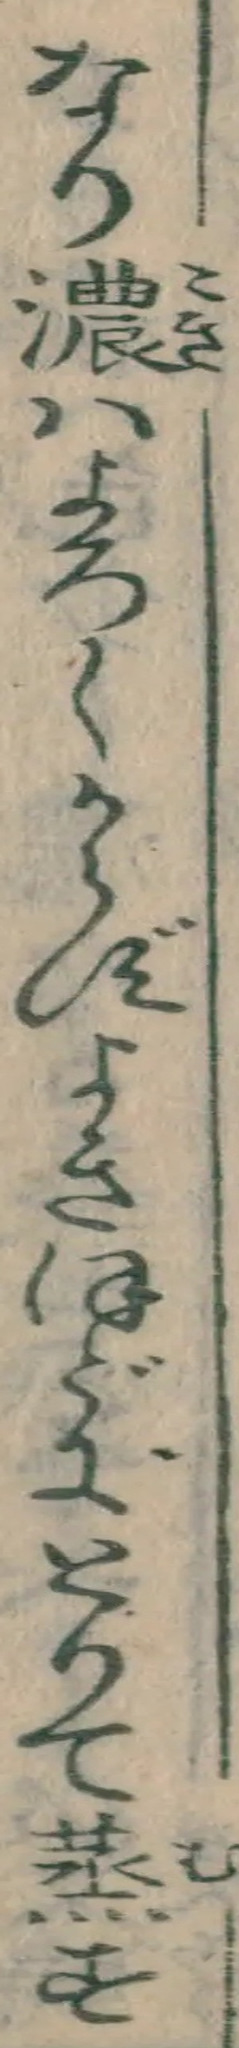なり濃はよろしからずよきほどにとりて蒸す
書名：豆腐百珍. 続編
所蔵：国立国会図書館 National Diet Library, JAPAN
